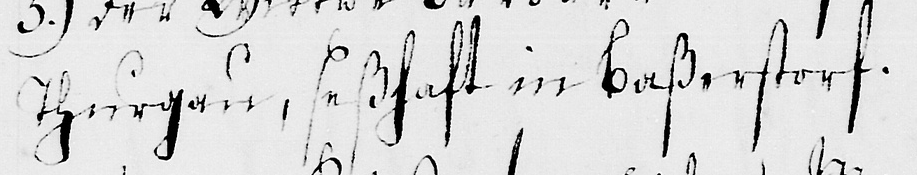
Thurgau, seßhaft in Baßerstorf.
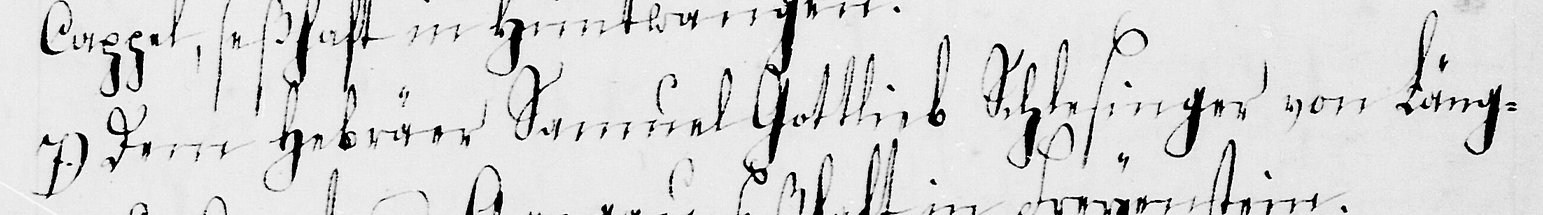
7.) Dem Hebräer Samuel Gottlieb Schlesinger von Läng¬
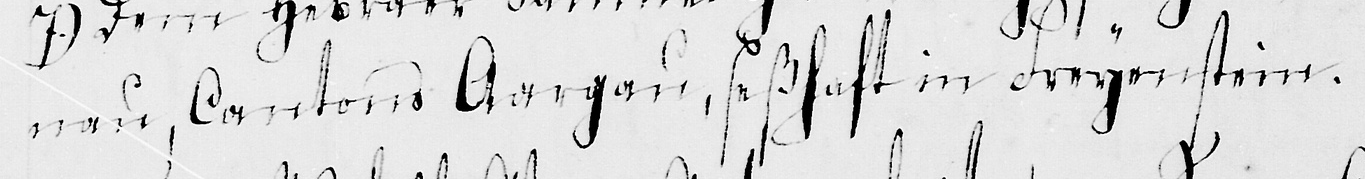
nau, Cantons Aargau, seßhaft in Freyenstein.
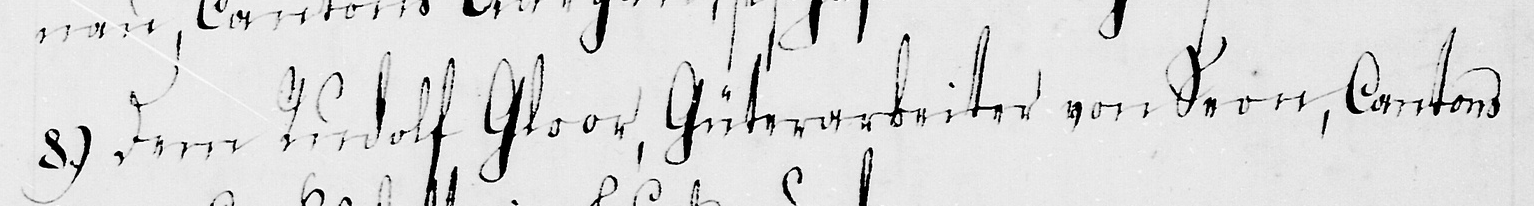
8.) Dem Rudolf Gloor, Güterarbeiter von Seon, Cantons
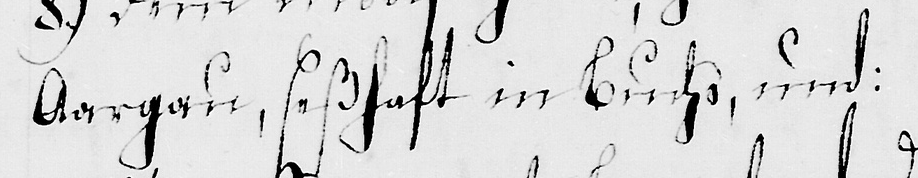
Aargau, seßhaft in Buchs, und:
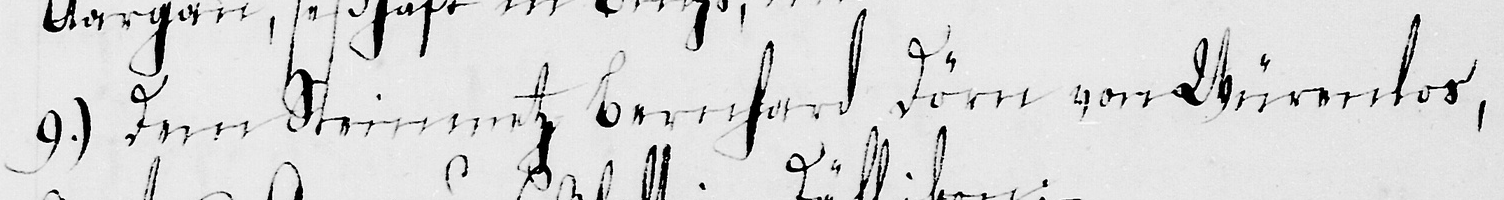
9.) Dem Steinmetz Bernhard Dörn von Würenlos,
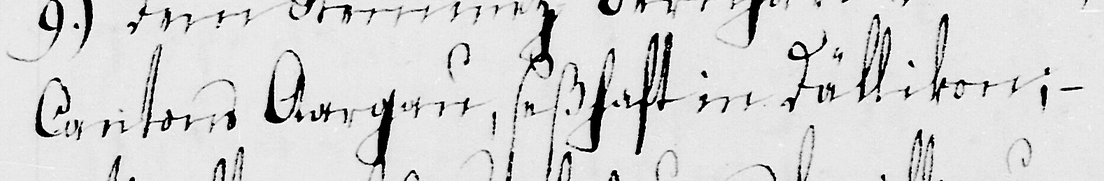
Cantons Aargau, seßhaft in Dällikon;
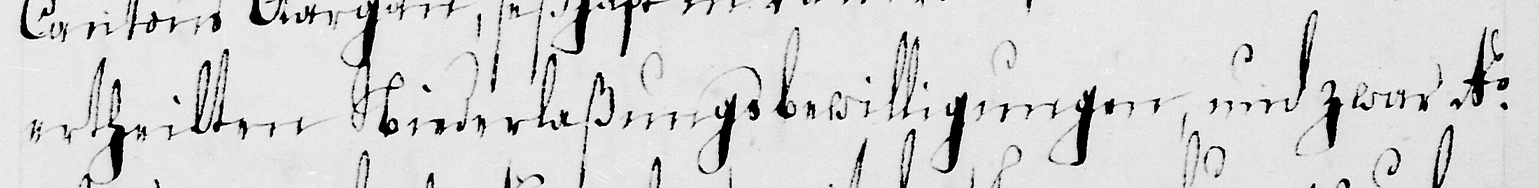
ertheilten Niederlaßungsbewilligungen, und zwar No.
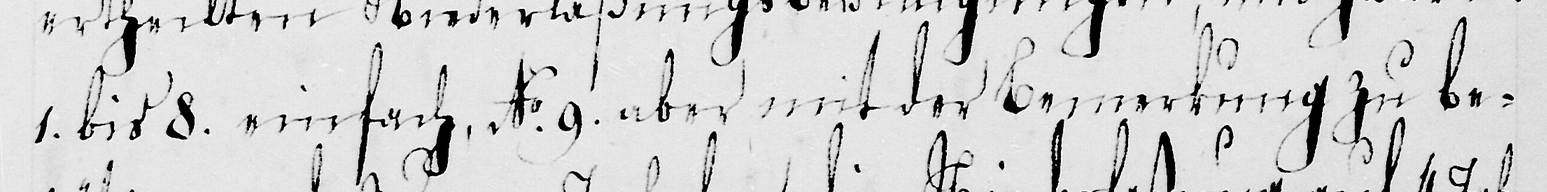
1. bis 8. einfach, No. 9. aber mit der Bemerkung zu be¬
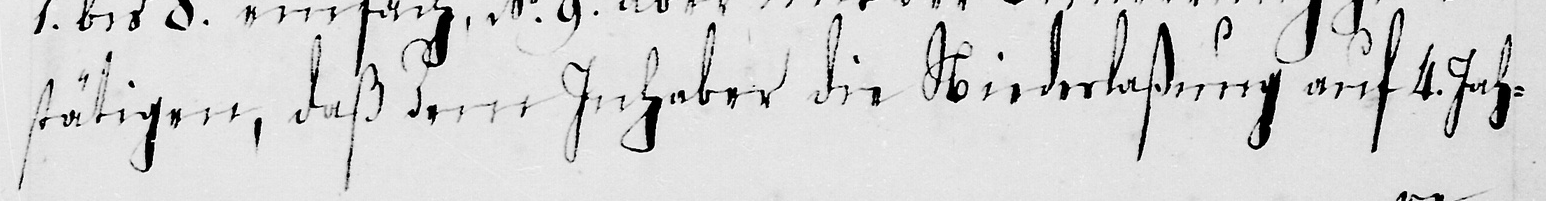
stätigen, daß dem Inhaber die Niederlaßung auf 4. Jah-
